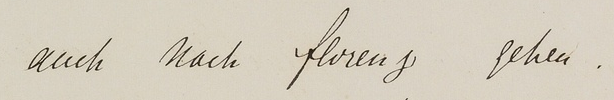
auch nach Florenz gehen.
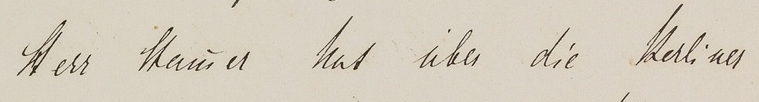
Herr Hammer hat über die Berliner
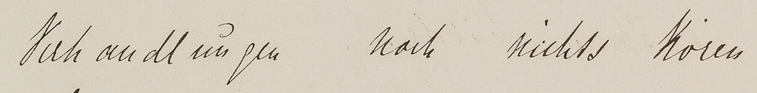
Verhandlungen noch nichts hören
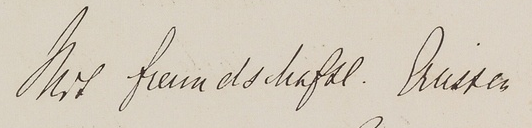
Mit freundschaftl. Grüssen
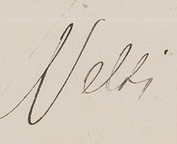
Welti
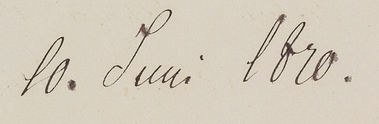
10. Juni 1870.
